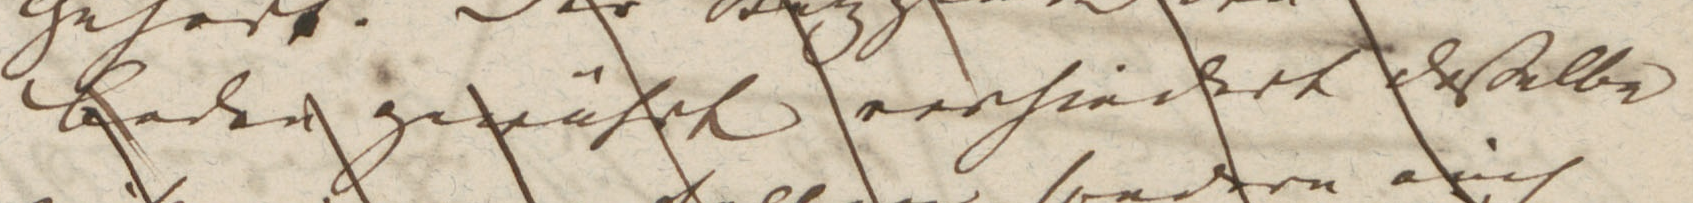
Boden gewährt verhindert dasselbe
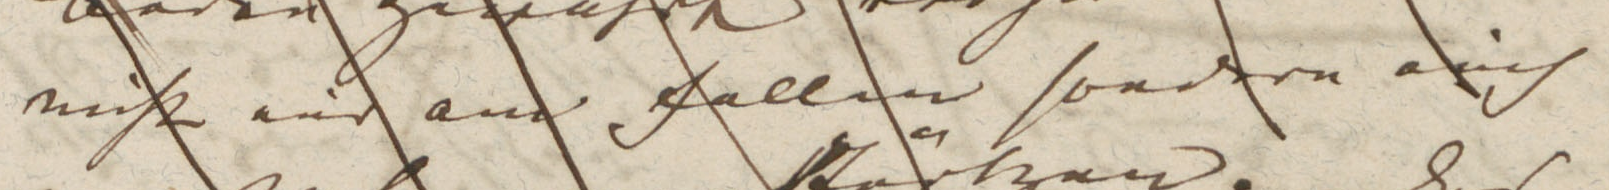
nicht nur am Fallen sondern auch
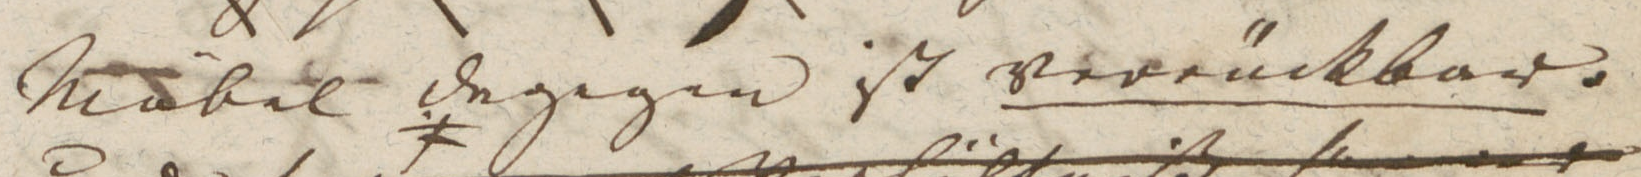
Möbel dagegen ist verrückbar.
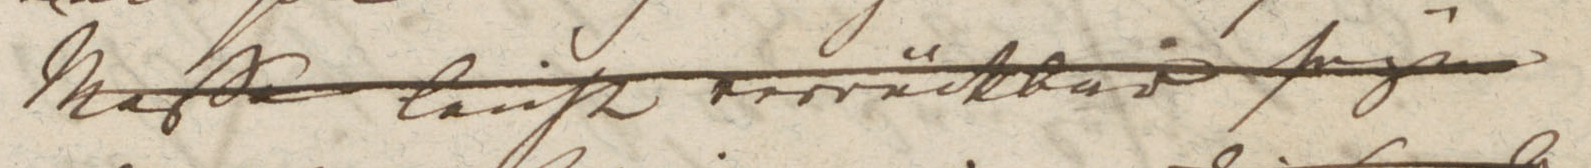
Masse leicht verrückbar seyn
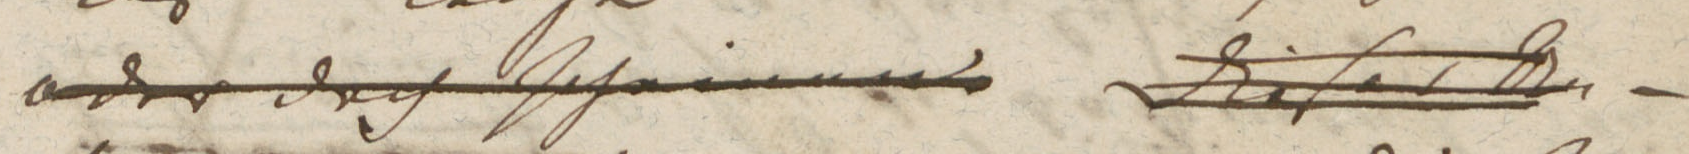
oder doch scheinen Dieser Un-
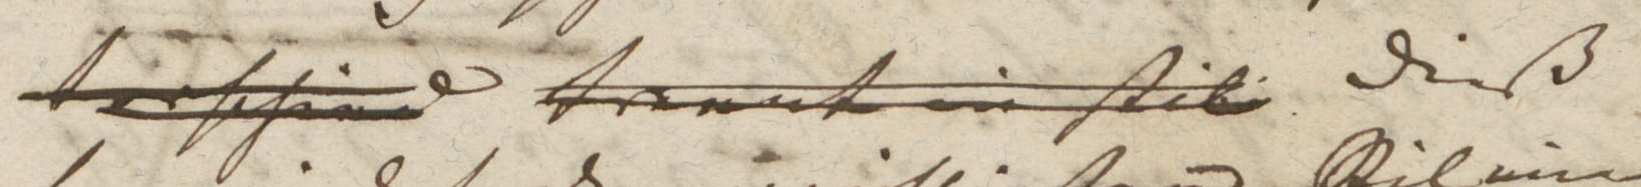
terschied trennt in stil Diess
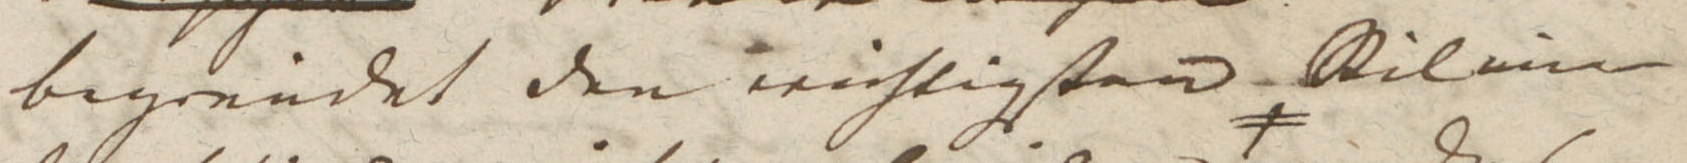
begründet den wichtigsten Stilun-
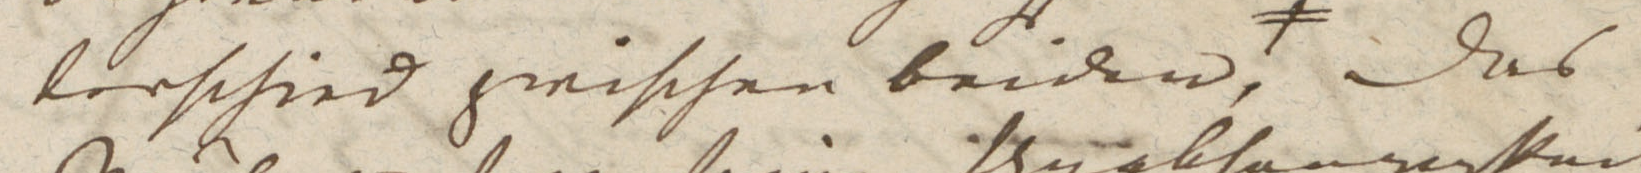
terschied zwischen beiden, % Das
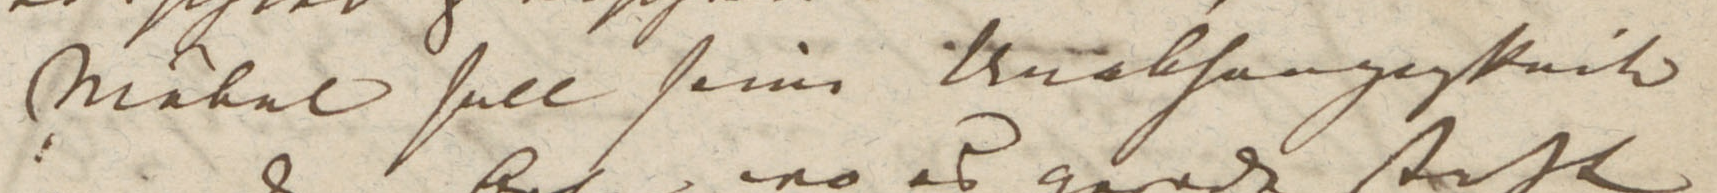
Möbel soll seine Unabhangigkeit
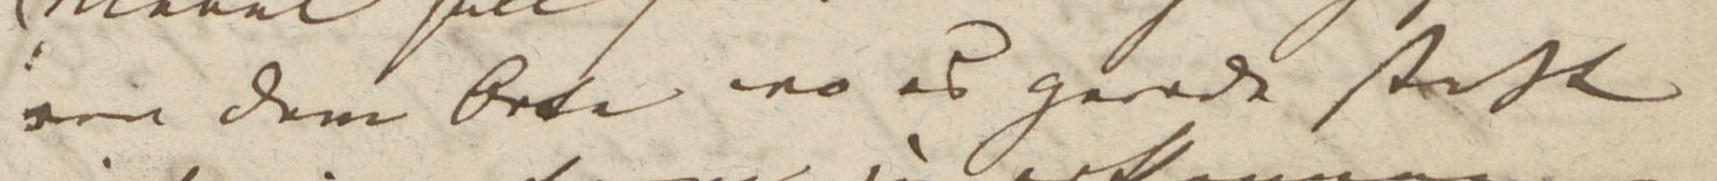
von dem Orte wo es gerade steht
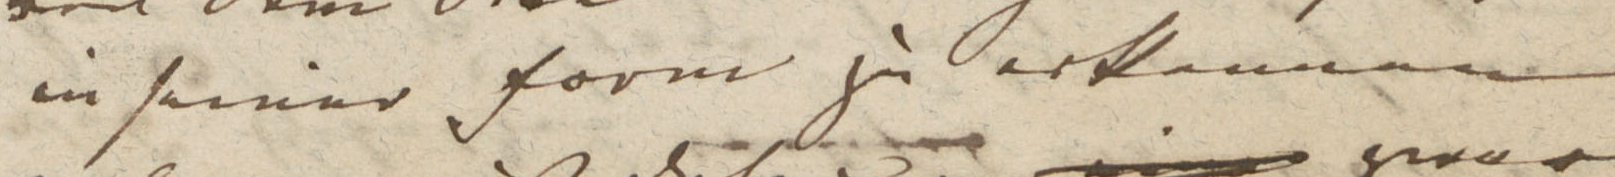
in seiner Form zu erkennen
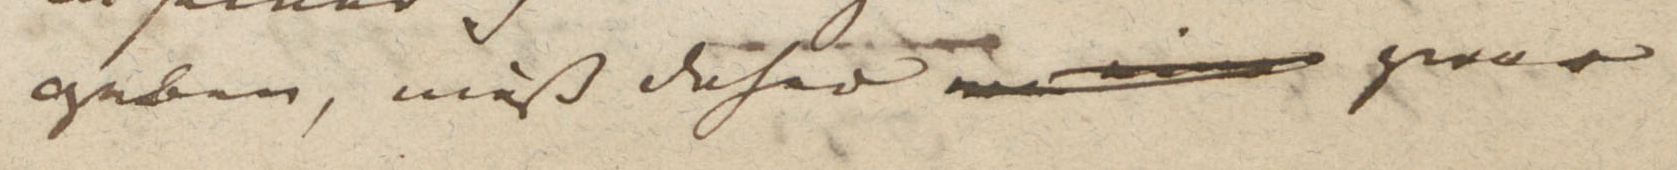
geben, muss daher eine zwar
